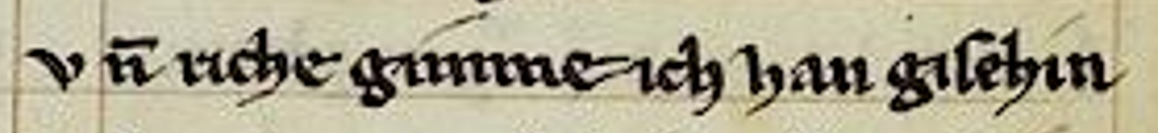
Vn(d) riche gimme ich han giſehin.
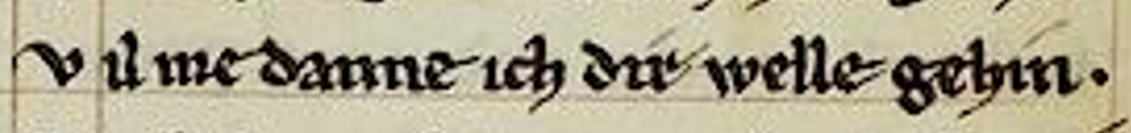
Vil me danne ich dir welle gehin.
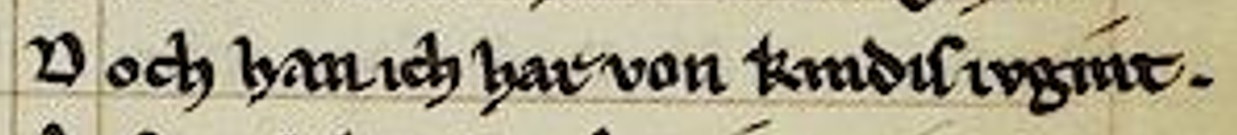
Doch han ich har von kindiſ ivgint.
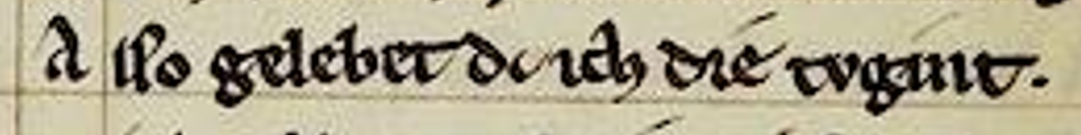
Alſo gelebet d(az) ich die tvgint.
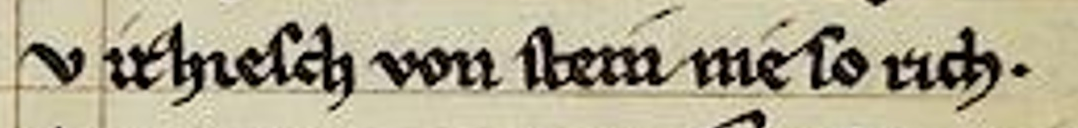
Virhieſch von ſtein nie ſo rich.
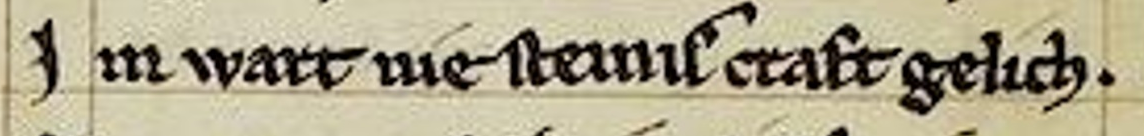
Im wart nie ſteiniſ craft gelich.
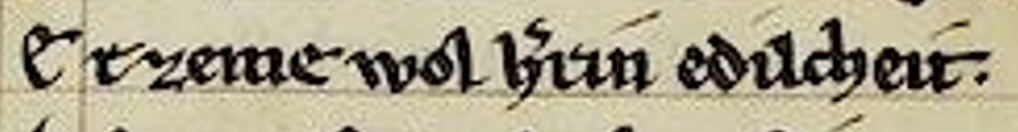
Er zeme wol h(er)rin edilcheit.
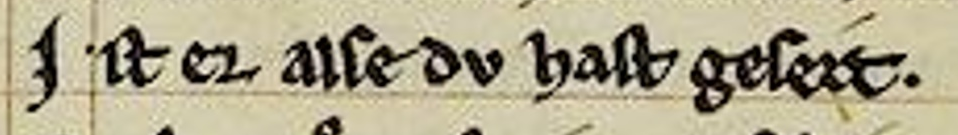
Iſt ez alſe dv haſt geſeit.
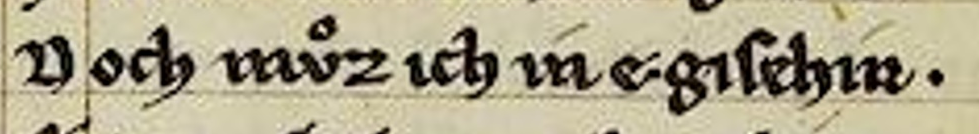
Doch mv°oz ich in e giſehin.
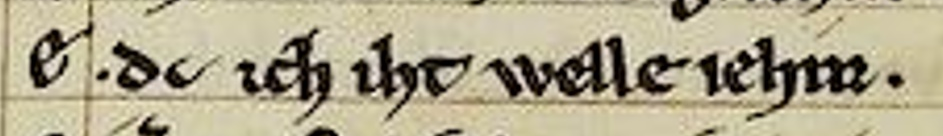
E. d(az) ich iht welle iehin.
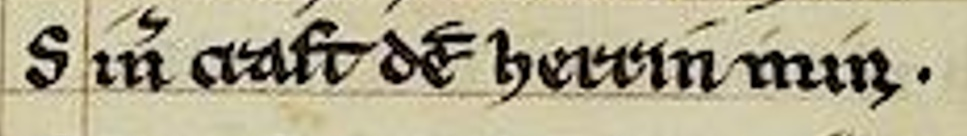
Sin(er) craft de(m) herrin min.
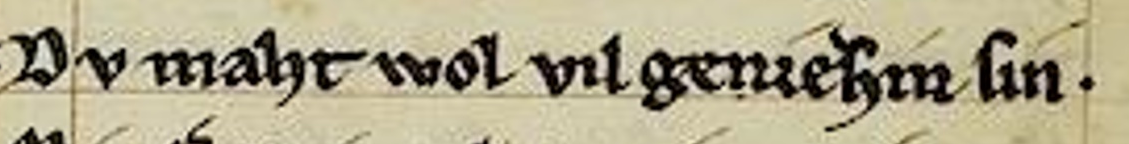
Dv maht wol vil genie?in ſin.
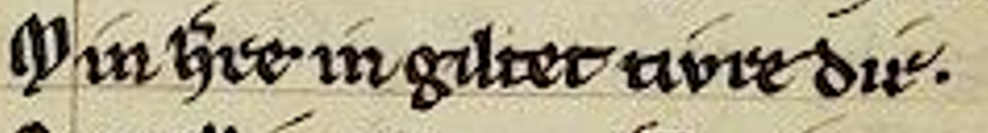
Min h(er)re in giltet tivre dir.
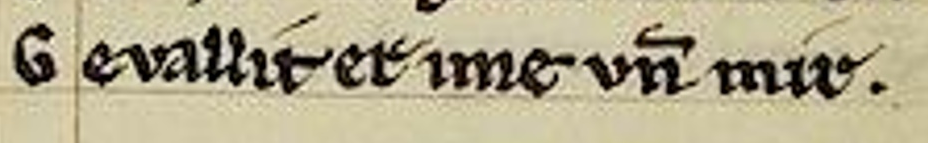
Gevallit er ime vn(d) mir.
